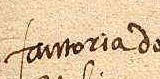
fautoria do
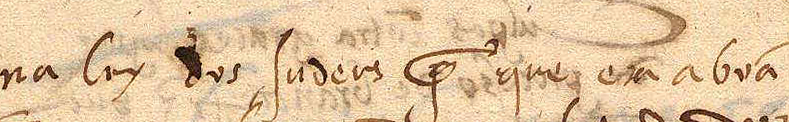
na ley dos Judeus p̄oque era a boā
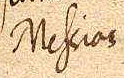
Messias
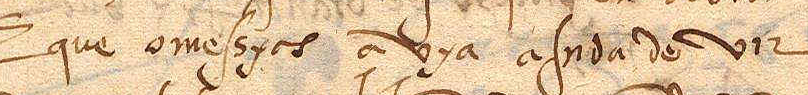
E que o messyas avya aJnda de vir
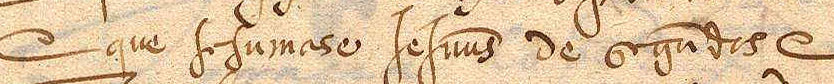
e que JeJumase JeJūus de segūdas e
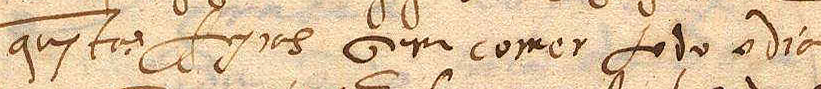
quj̄tas feyras sem comer todo o dia
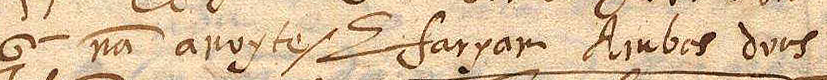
sen̄a a noyte / E faryam Ambas dous
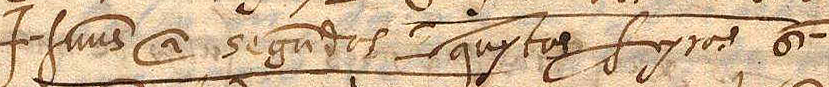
JeJuūs ē segūdas E quȳtas feyras sē
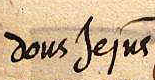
dous Jejūs
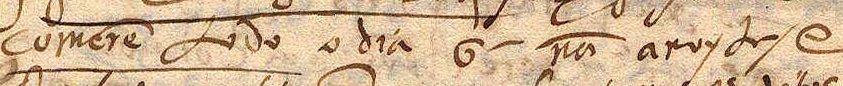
comerē todo o dia sen̄a a noyte / e
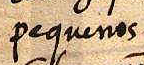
pequenos
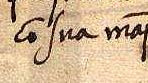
cō sua māj
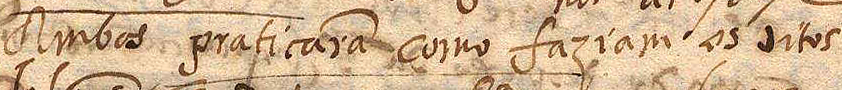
Ambos praticarā como faziam os ditos
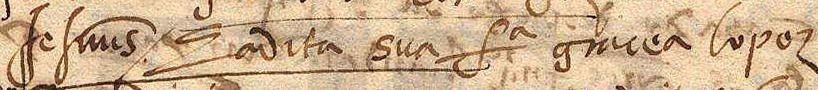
JeJūus E a dita sua fa gracea lopez
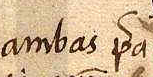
ambas p̄a
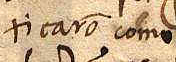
ficarō como
